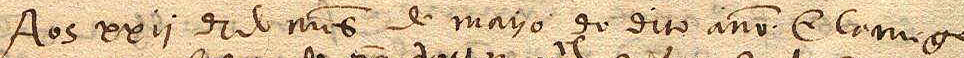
Aos xxij dj do mēs de mayo do dito an̄o ē lamego
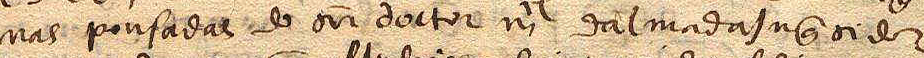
nas pousadas do sōr doctor mel dalmada Jnq̄sidor
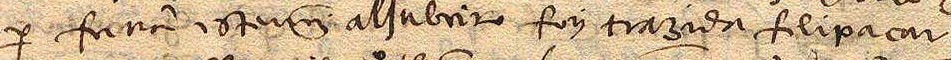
ꝑ fernā esteuez alJubeiro foy trazida felipa car
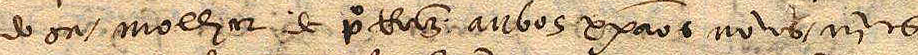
dosa / molher de po Roiz̄ anbos xpãos novos / mres
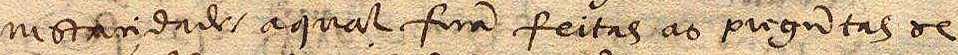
nesta cidade / a qual forā feitas as pregūtas se
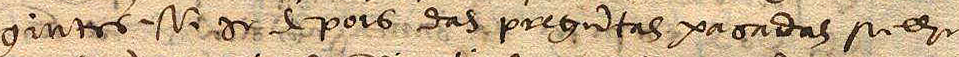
gintes .ss. se depois das pregūtas pasadas se lhe
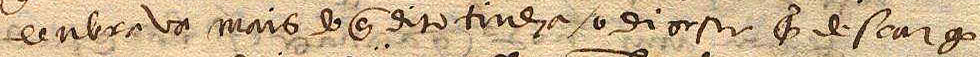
lembrava mais do q̄ dito tinha / o disese p̄o descargo
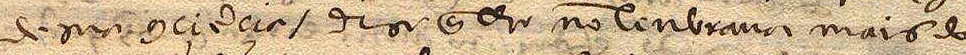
de sua ꝯciēcia / dise q̄ lhe n̄o lenbraua mais do
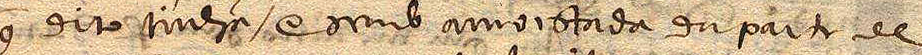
q̄ dito tinha / e sendo amoestada da parte de
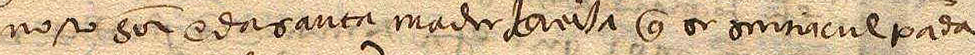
noso sōr e da santa madre JgreiIa q̄ se sentia culpada
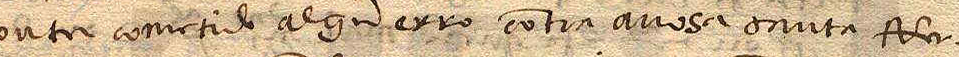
ou ter cometido algū erro c̄otra a nosa santa ffee
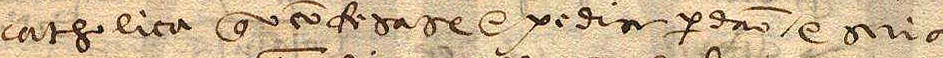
catholica q̄ c̄ofesase e pedise ꝑdão / e seria
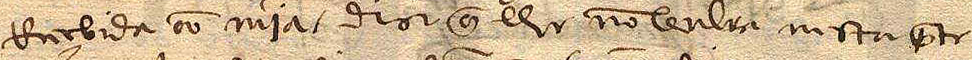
Recebida c̄o mj̄a / dise q̄ lhe n̄o lenbra nesta p̄te
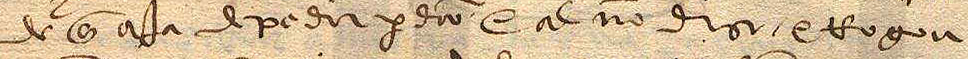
de q̄ aJa de pedir ꝑdão. e al n̄o dise / e Rogou
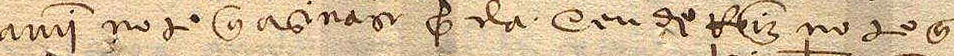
a mj̄ noto q̄ asinase p̄o ela, e eu djo Roīz noto q̄
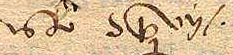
esto sp̄vy /.
